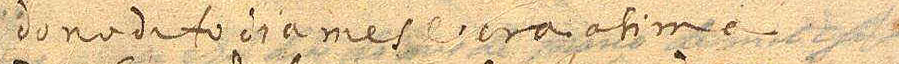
do no dito dia mes e era asima
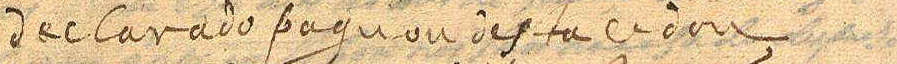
declarado paguou desta & dou
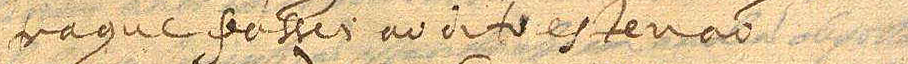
tra que passei ao dito esteuaõ
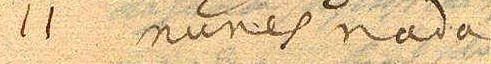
nunes nada
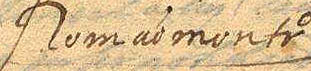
Romaõ montro
